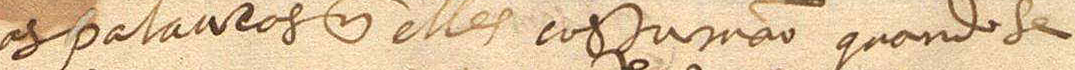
as palauras q̄ elles costumaõ quando se
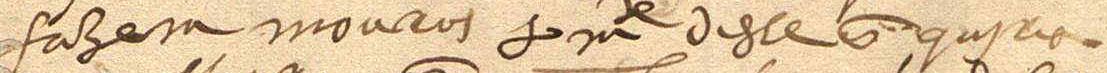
fazem mouros somte disse q̄ qujria
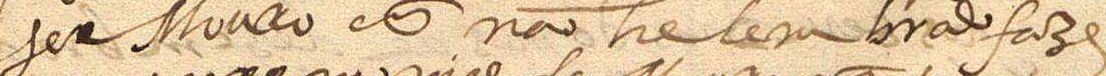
ser Mouro e q̄ não he lembrado fazer
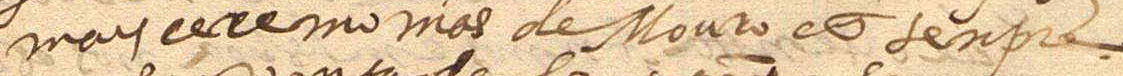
mais ceremonias de Mouro e q̄ senpre
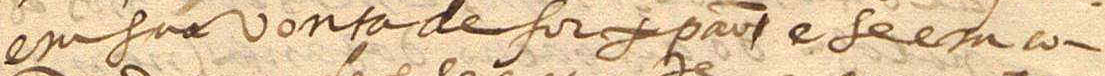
em sua vontade foi xpaõs e se emco
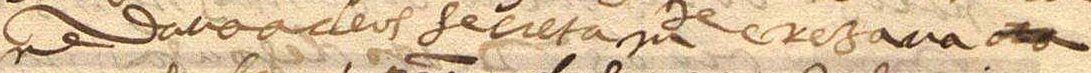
mēdaua a deos secretamte e rezaua
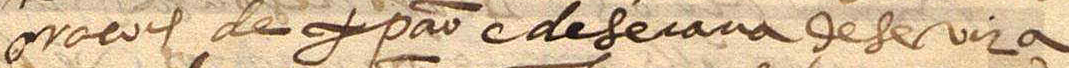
oracois de xpaõ e deseiaua de se vir a
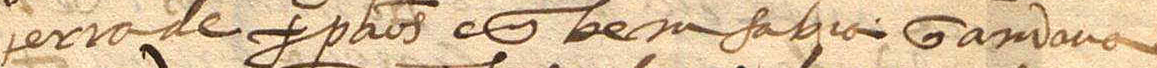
terra de xpaõs e q̄ bem sabia q̄ andaua
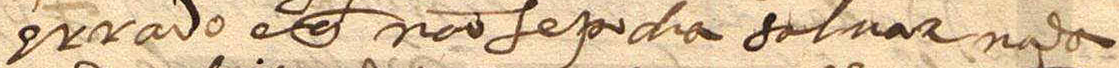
Errado e q̄ naõ se podia saluar na da
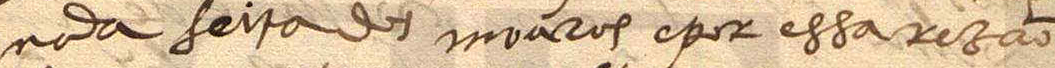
nada seita dos mouros e por essa rezaõ
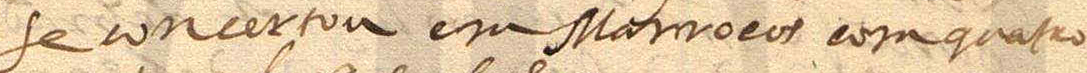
se concertou em Marrocos com quatro
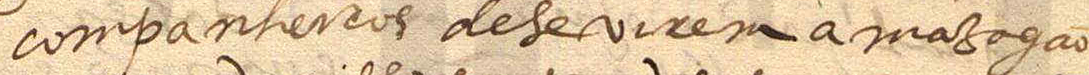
companheiros de se virem a mazagaõ
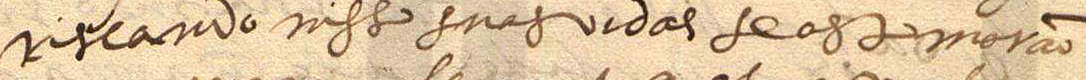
riscando nisso suas vidas se os tomaraõ
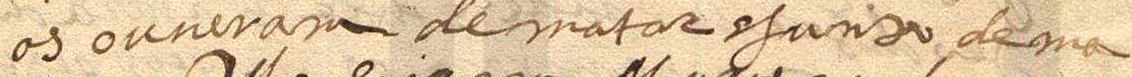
os ouueram de matar E Junto de ma
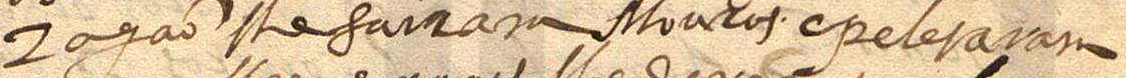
zagaõ lhe sairam Mouros e pelejaram
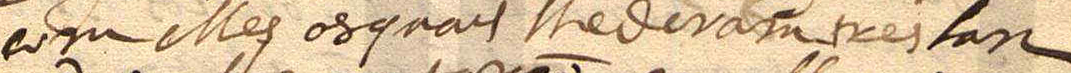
com elles os quais lhe deram tres lan
